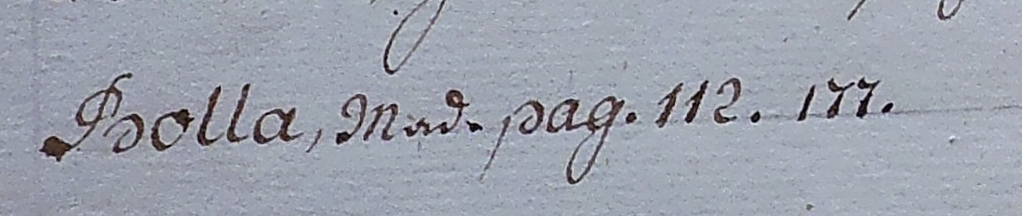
Bolla, Mad. pag. 112. 177.
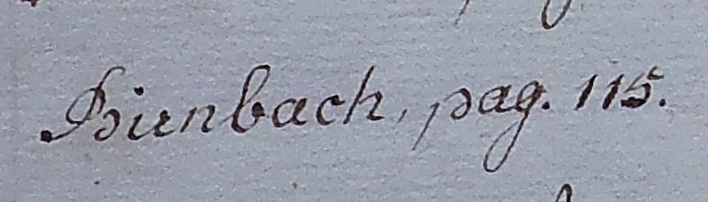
Birnbach, pag. 115.
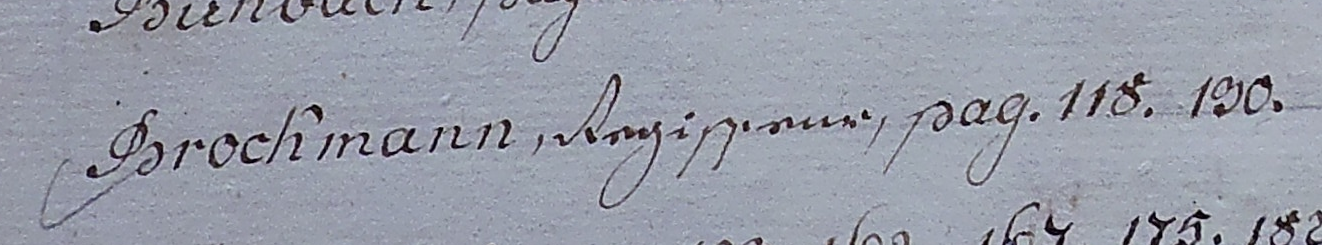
Brockmann, Regisseur, pag. 118. 130.
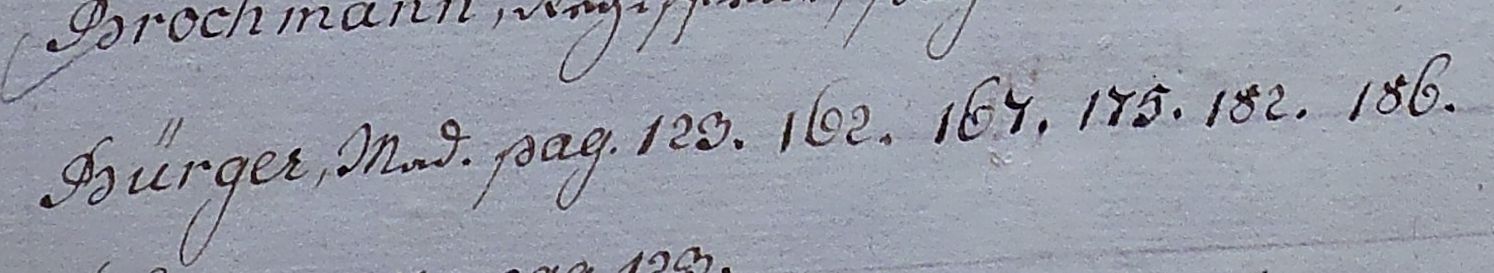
Bürger, Mad. pag. 123. 162. 167. 175. 182. 186.
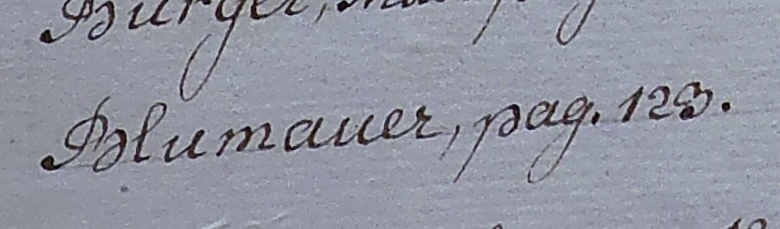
Blumauer, pag 123.
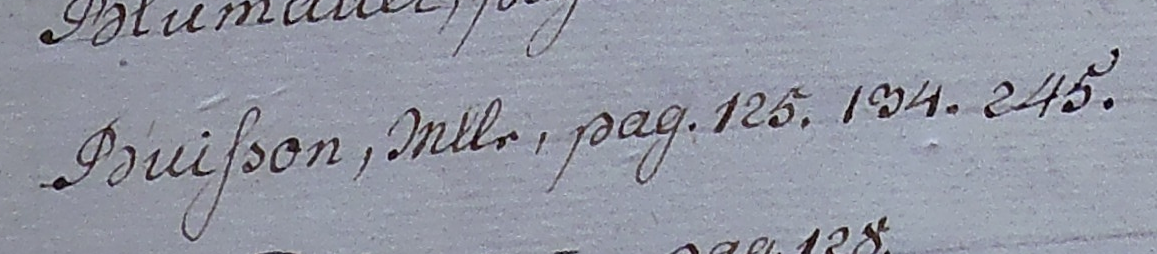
Buisson, Mlle, pag 125. 134. 245.
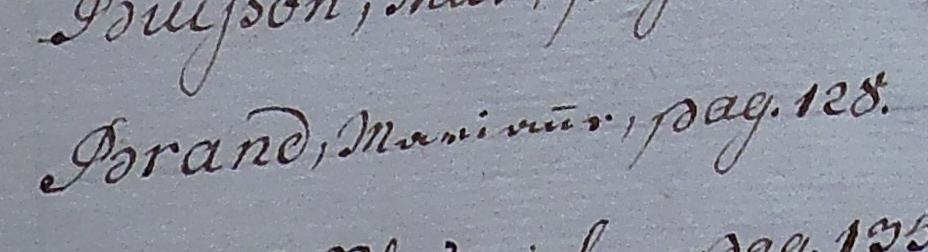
Brand, Marian̅e, pag. 128.
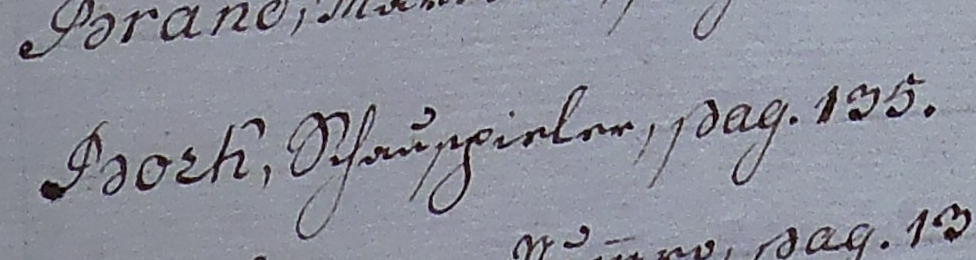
Bork, Schauspieler, pag. 135.
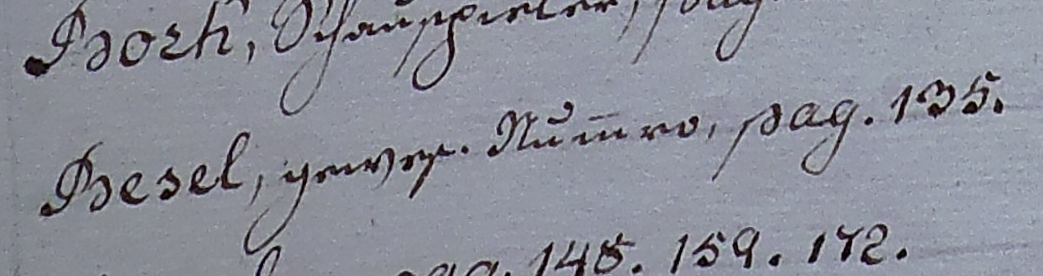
Besel, gewes. Num̅ro, pag. 135.
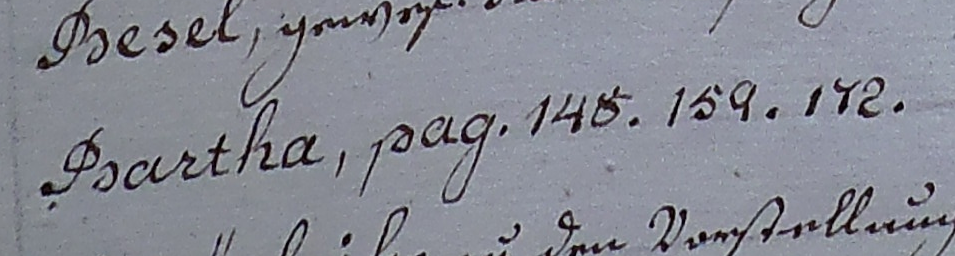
Bartha, pag. 145. 159. 172.
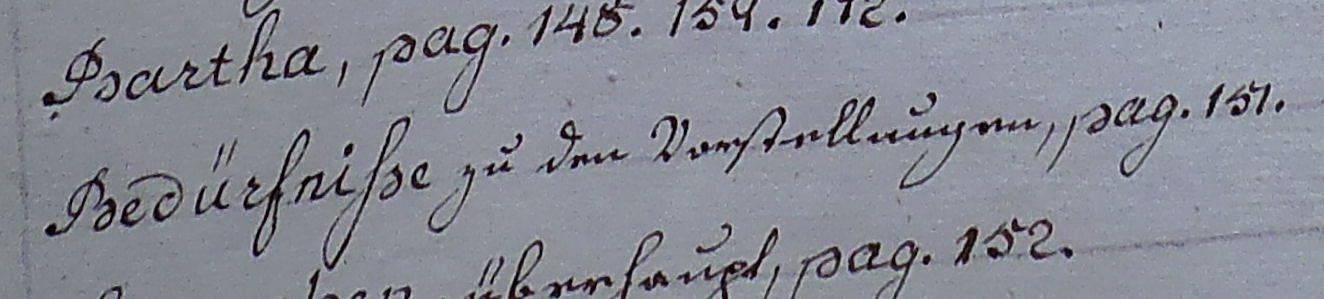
Bedürfnisse zu den Vorstellungen, pag 151.
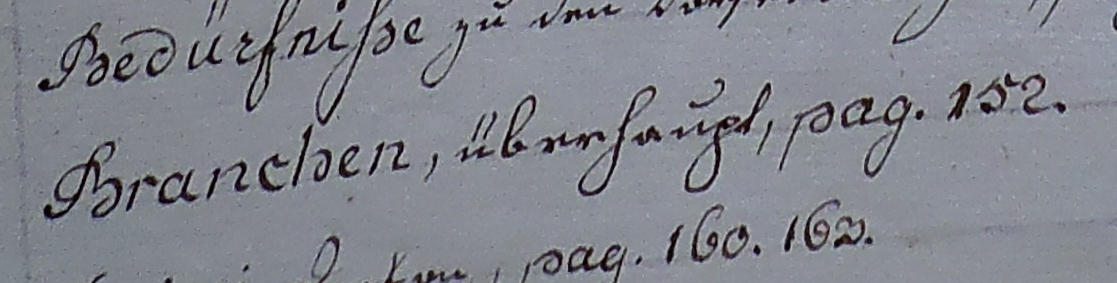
Branchen, überhaupt, pag. 152.
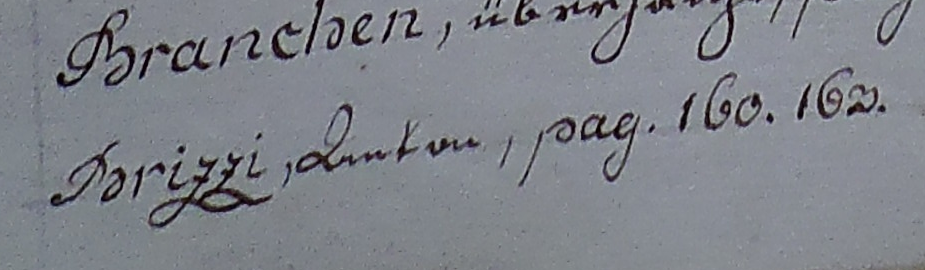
Brizzi, Anton, pag. 160. 163.
